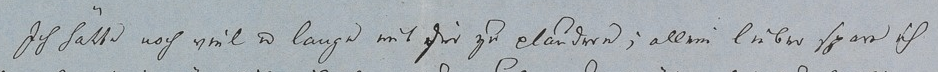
Ich hätte noch viel & lange mit dir zu plaudern; allein lieber spare ich
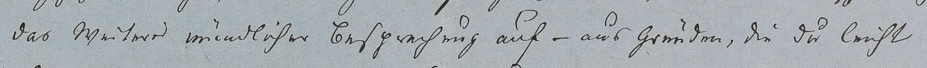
das Weitere mündlicher Besprechung auf – aus Gründen, die du leicht
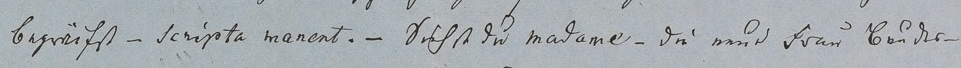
begreifst – scripta manent. – Siehst du madame – die neue Frau Bundes-
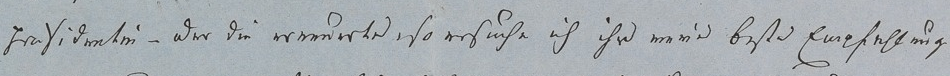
präsidentin oder die erneuerte, so ersuche ich ihr meine beste Empfehlung
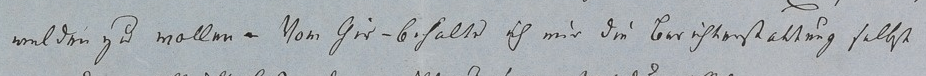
melden zu wollen – Vom Gir – behalte ich mir die Berichterstattung selbst
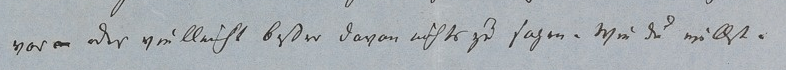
vor – oder vielleicht besser davon nichts zu sagen. Wie du willst.
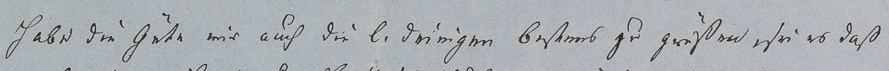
Habe die Güte mir auch die l. Deinigen bestens zu grüßen, sei es daß
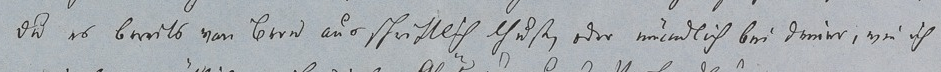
du es bereits von Bern aus schriftlich thust, oder mündlich bei deiner, wie ich
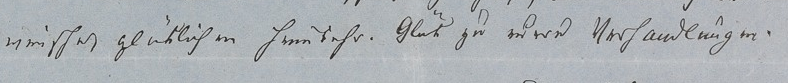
wünsche, glücklichen Heimkehr. Glük zu euern Verhandlungen.
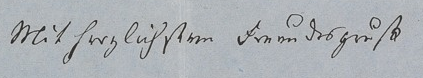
Mit herzlichstem Freundesgruß
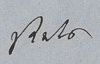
stets
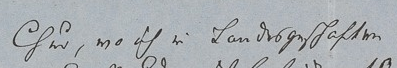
Chur, wo ich in Landesgeschäften
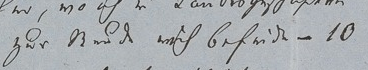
zur Stunde mich befinde – 10
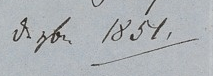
Dezbr 1851.
